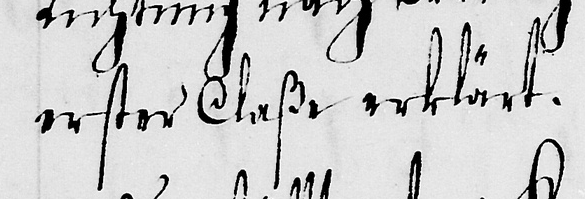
erster Claße erklärt.
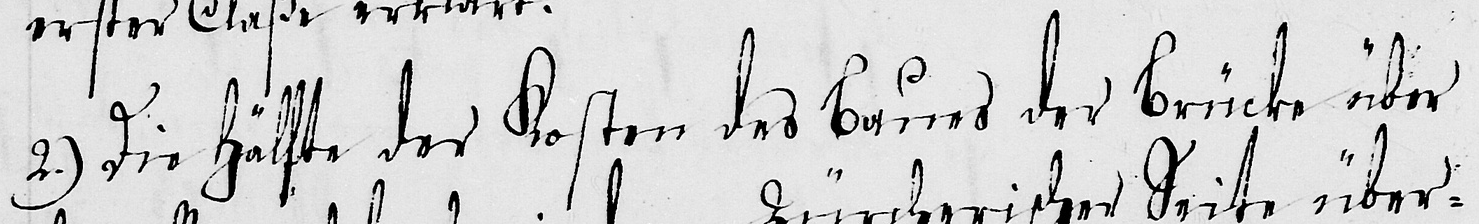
2.) Die Hälfte der Kosten des Baues der Brücke über
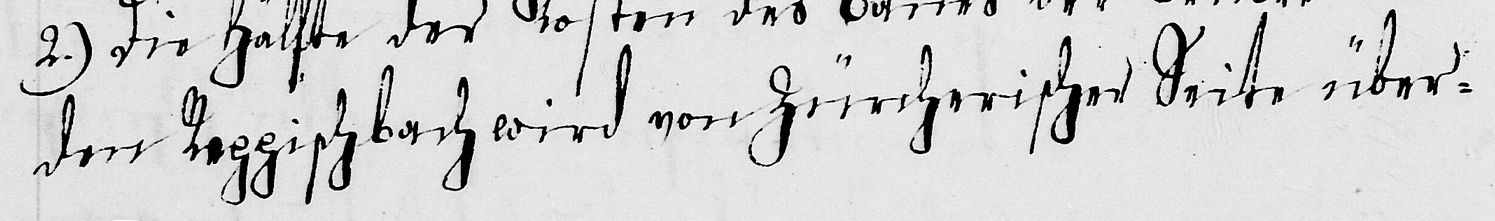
den Reppischbach wird von Zürcherischer Seite über¬
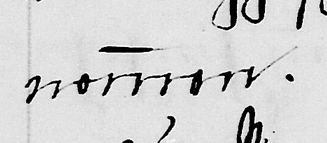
nommen.
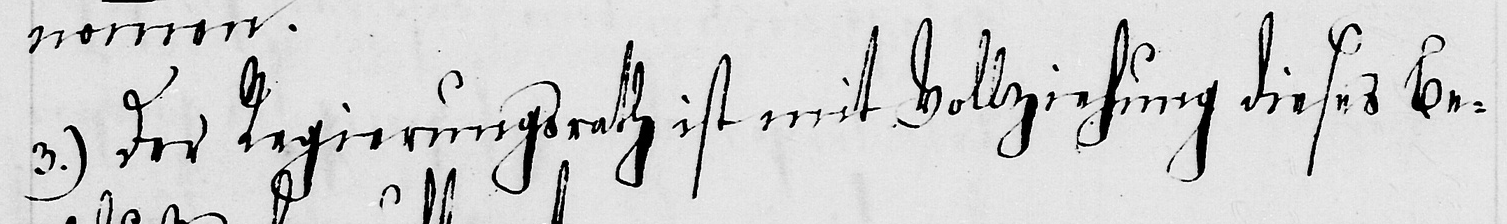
3.) Der Regierungsrath ist mit Vollziehung dieses Be¬
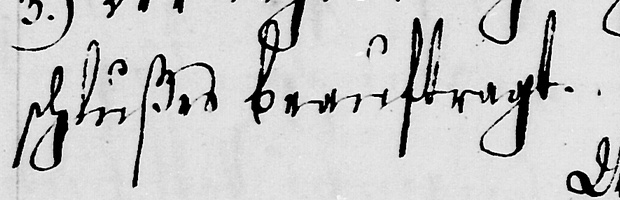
schlußes beauftragt.
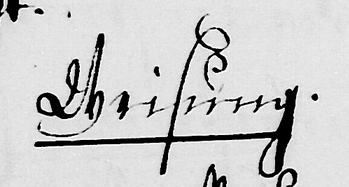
Weisung.
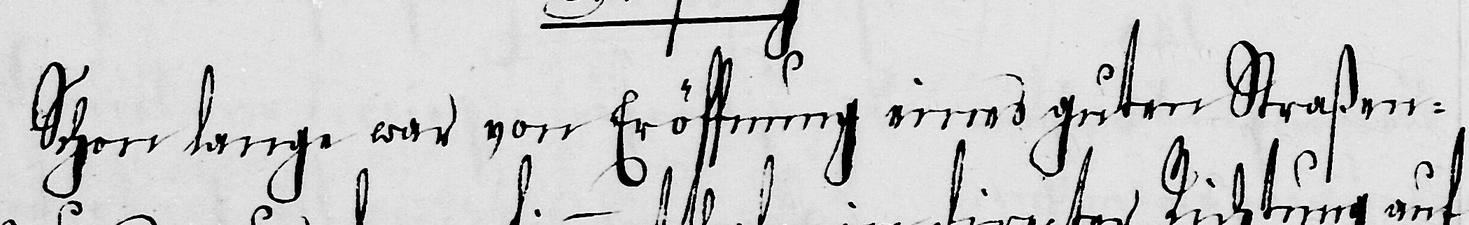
Schon lange war von Eröffnung eines guten Straßen¬
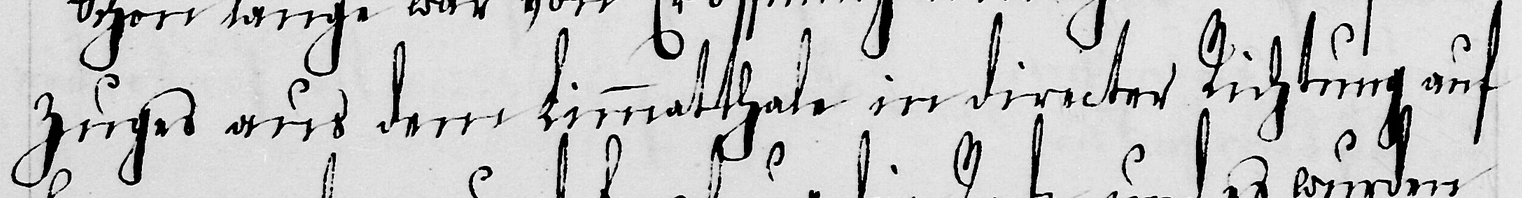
zuges aus dem Limmatthale in directer Richtung auf
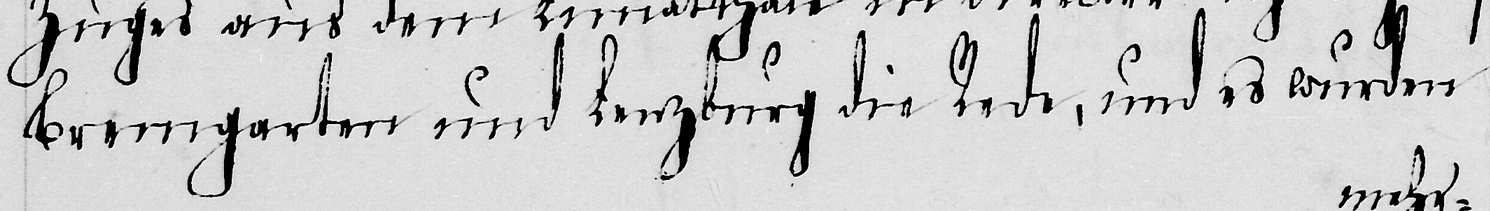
Bremgarten und Lenzburg die Rede, und es wurden
